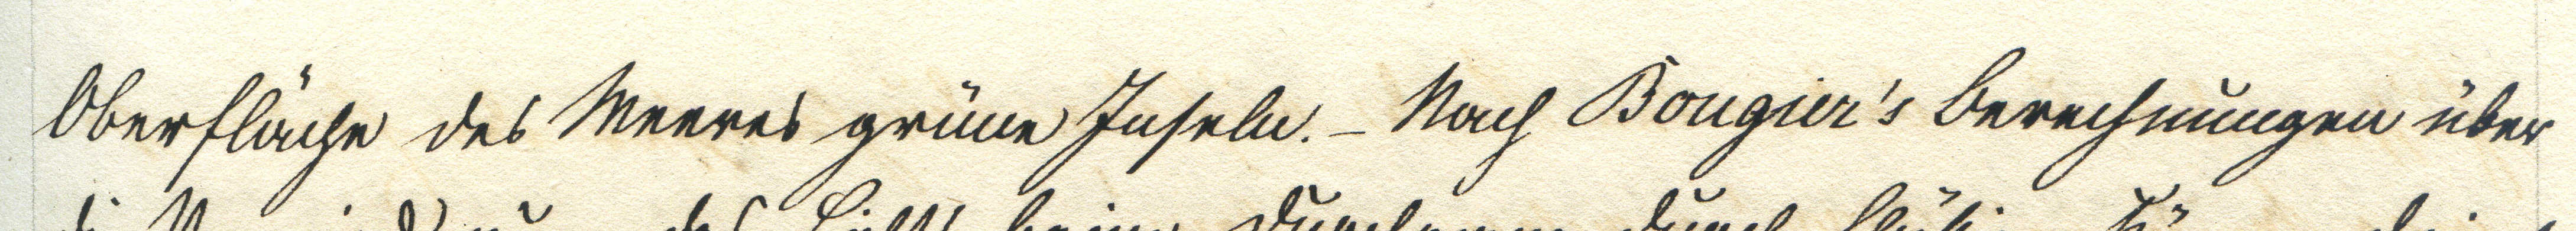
Oberfläche des Meeres grüne Inseln. – Nach Bougier’s Berechnungen über
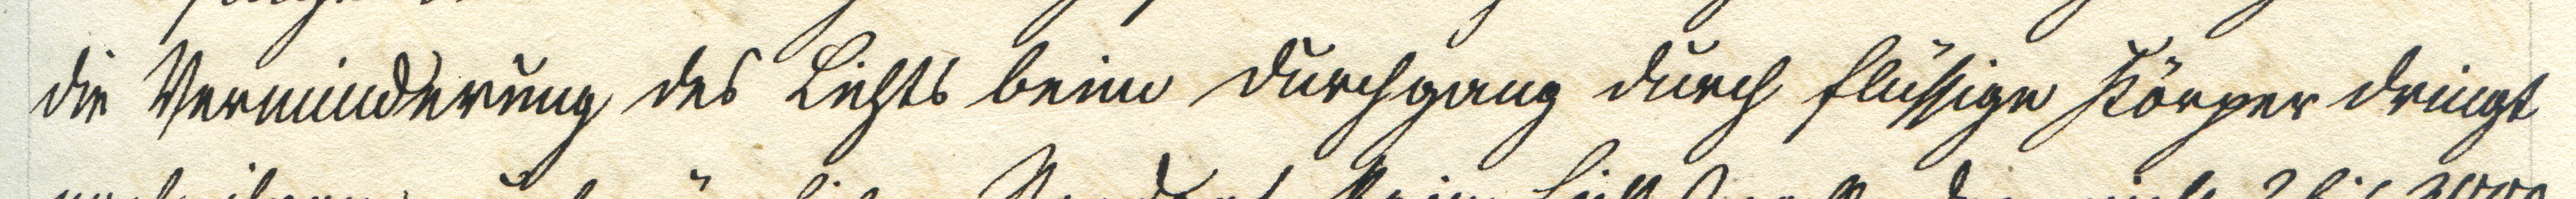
die Verminderung des Lichts beim Durchgang durch flüssige Körper dringt
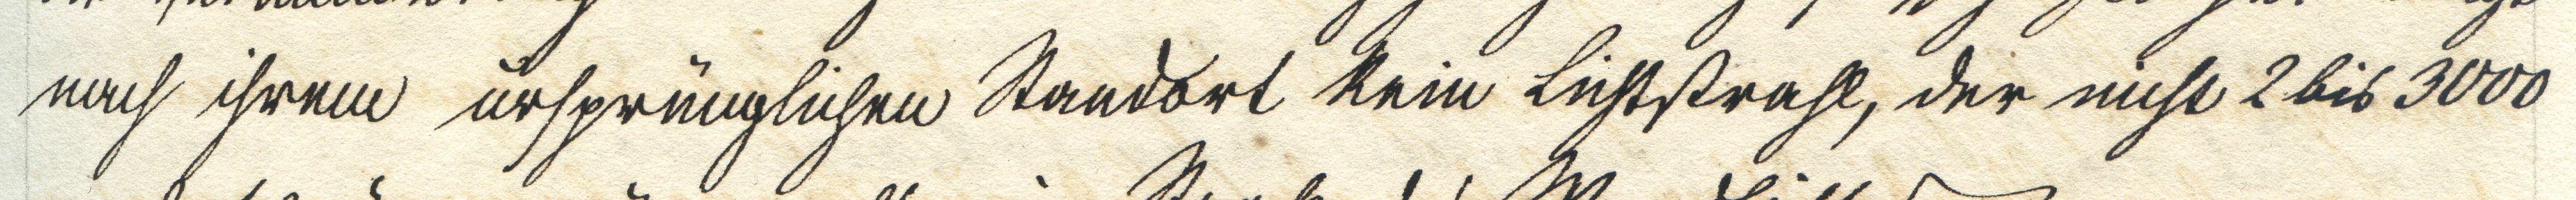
nach ihrem ursprünglichen Standort kein Lichtstrahl, der nicht 2 bis 3000
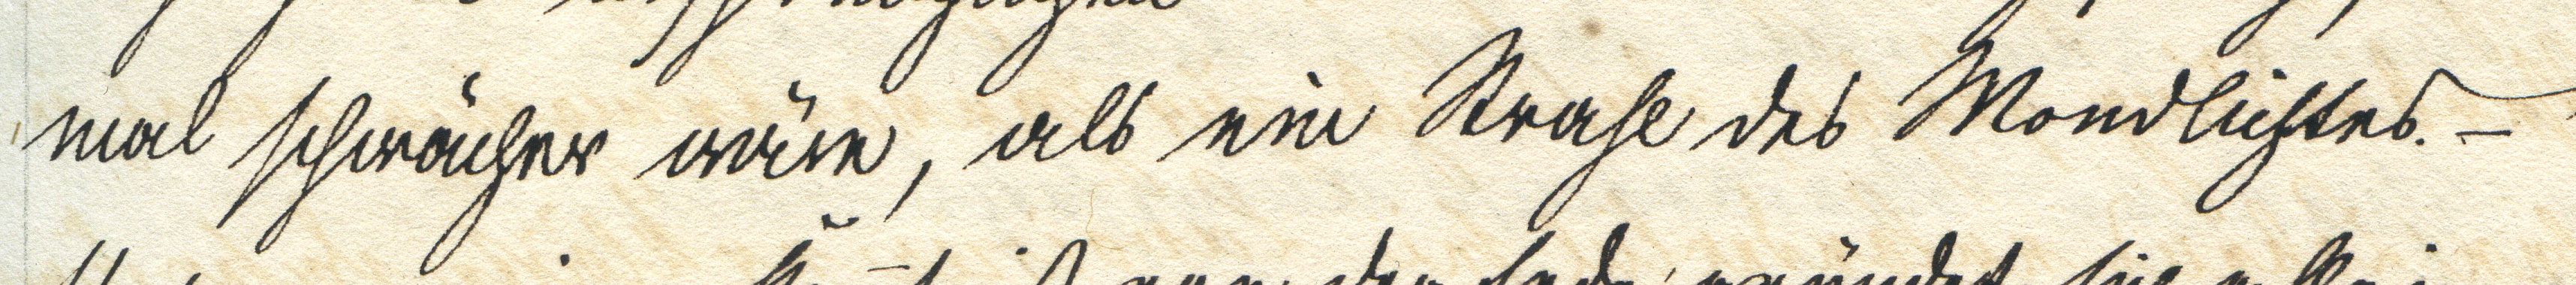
mal schwächer wäre, als ein Strahl des Mondlichtes. –
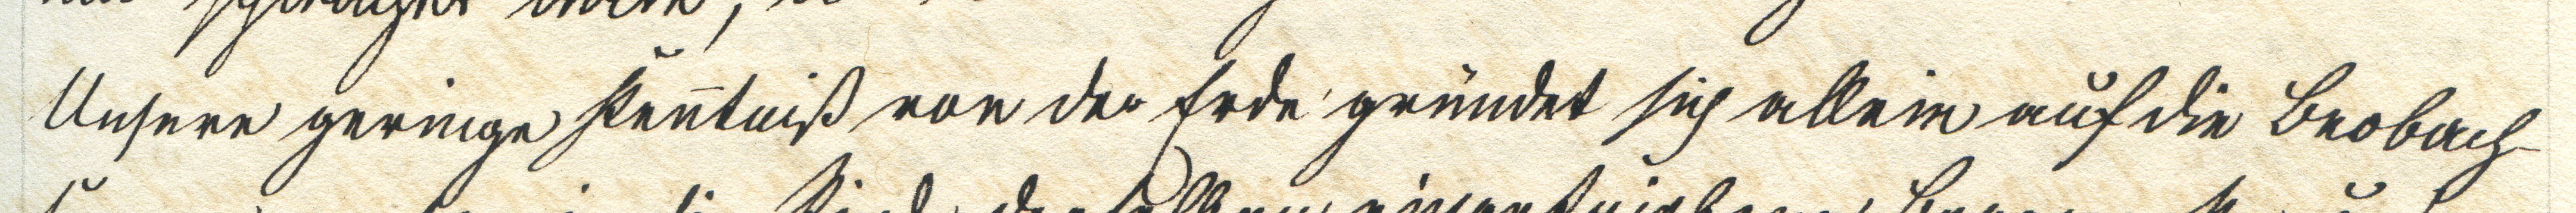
Unsere geringe Keñtniß von der Erde gründet sich allein auf die Beobach-
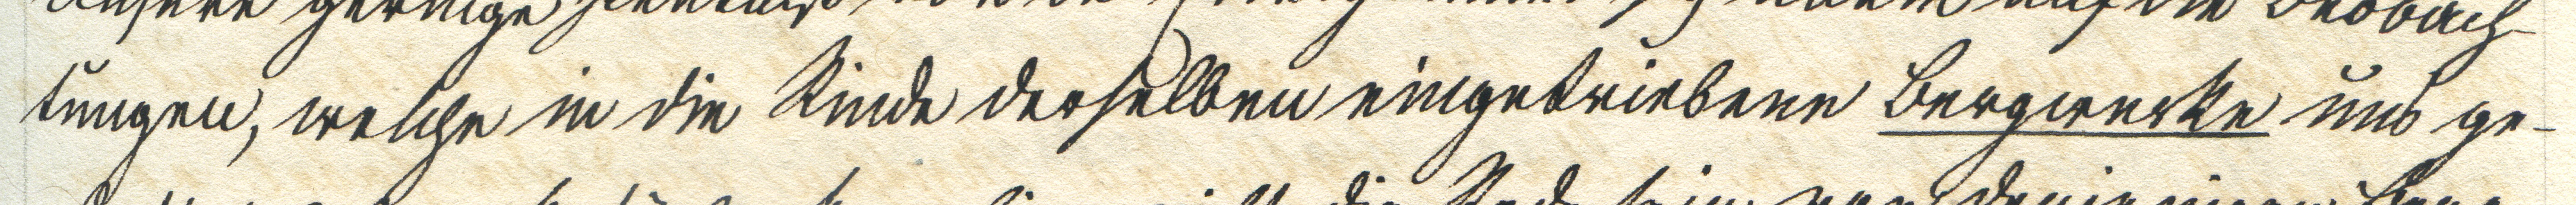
tungen, welche in die Rinde derselben eingetriebene Bergwerke uns ge-
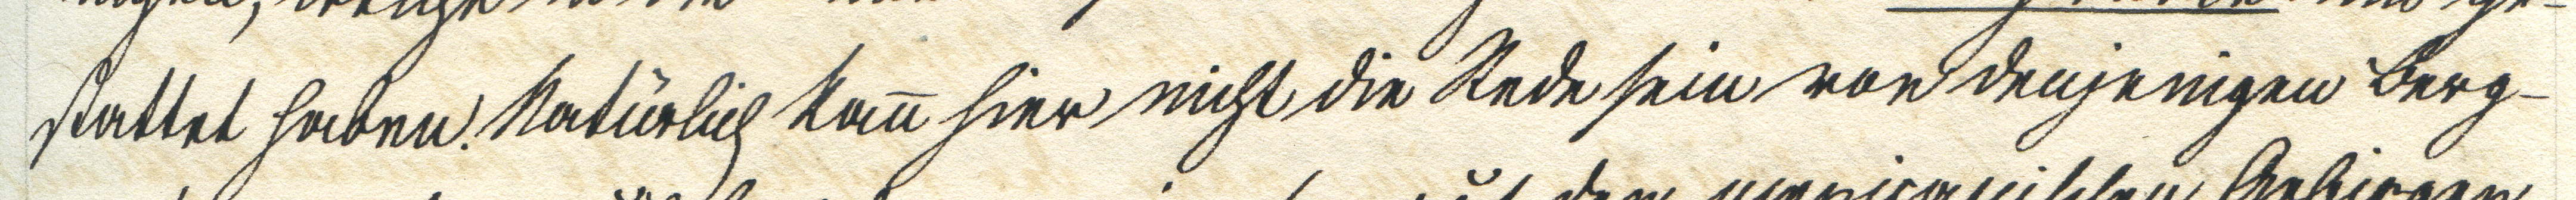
stattet haben. Natürlich kañ hier nicht die Rede sein von denjenigen Berg-
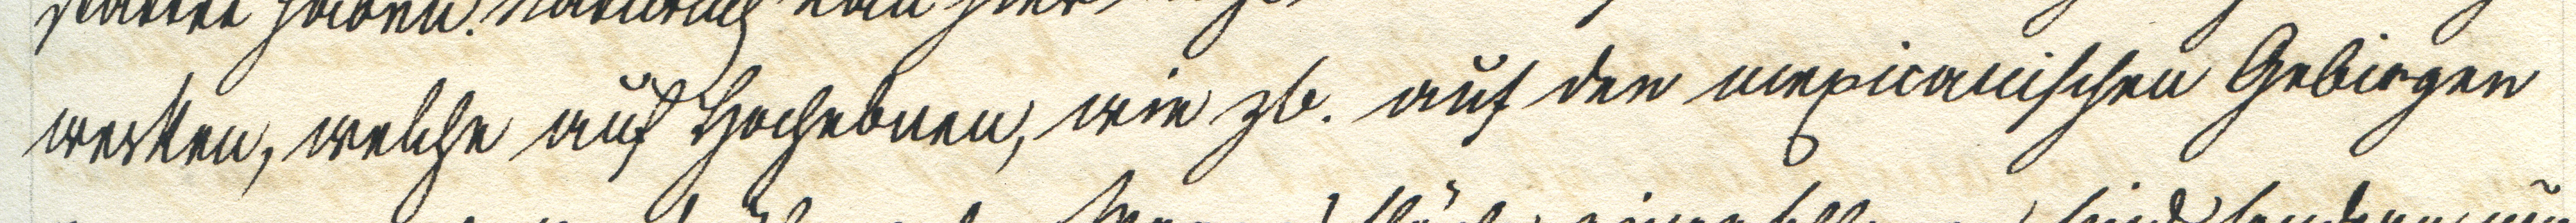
werken, welche auf Hochebnen, wie zb. auf den mexicanischen Gebirgen
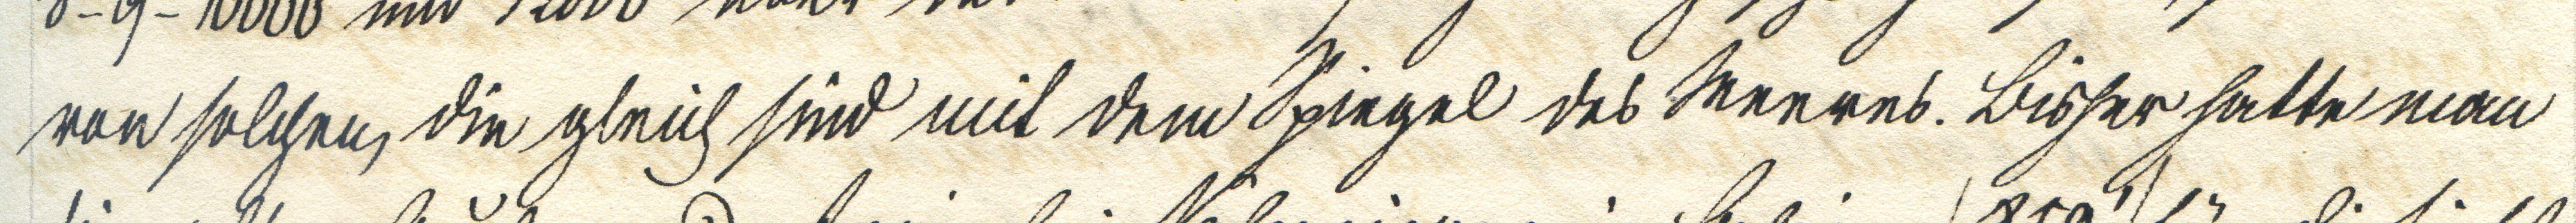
von solchen, die gleich sind mit dem Spiegel des Meeres. Bisher hatte man
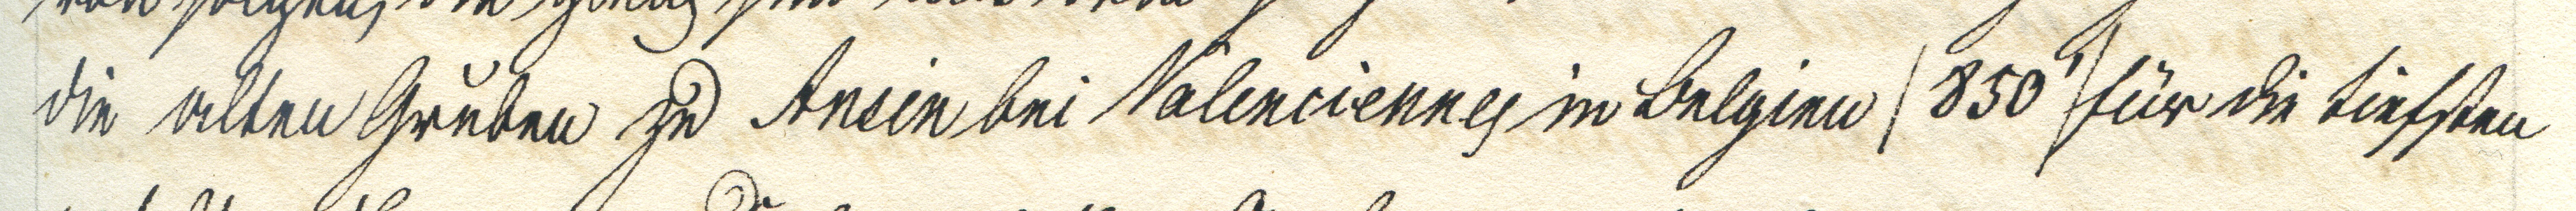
die alten Gruben zu Ansin bei Valenciennes in Belgien
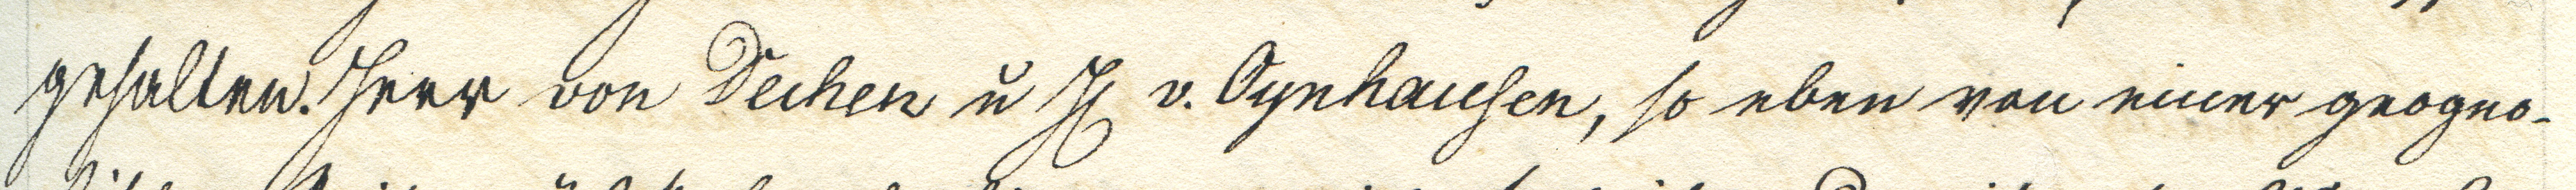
gehalten. Herr von Dechen u H￼ v. Oynhausen, so eben von einer geogno-
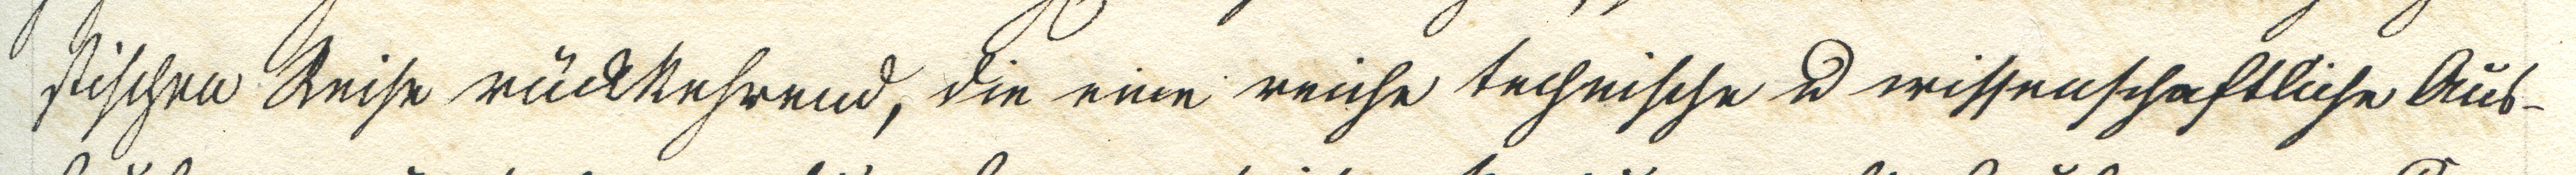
stischen Reise rückkehrend, die eine reiche technische u wissenschaftliche Aus-
